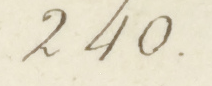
240.
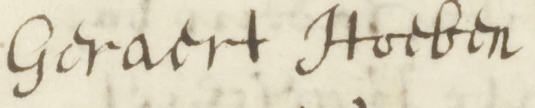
Geraert Hoeben
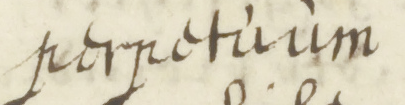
perpetuum
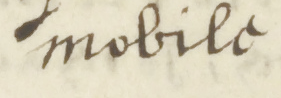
mobile
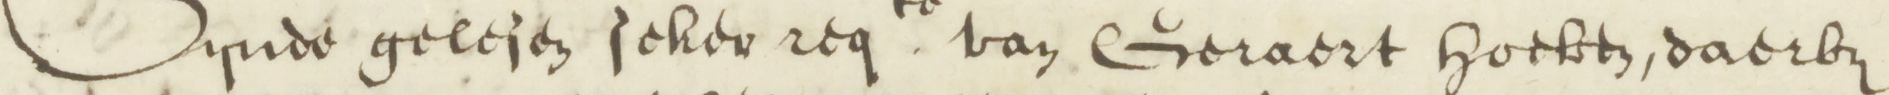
Synde gelesen seker reqte van Geraert Hoeben, daerby
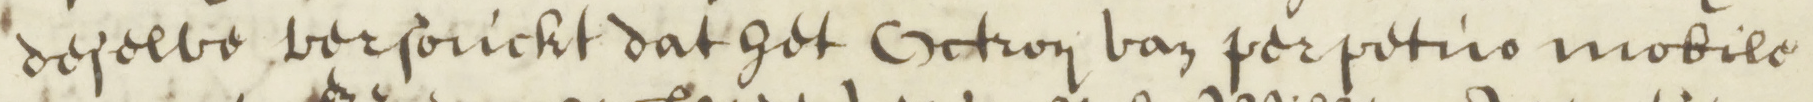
deselve versouckt dat het Octroy van perpetuo mobile
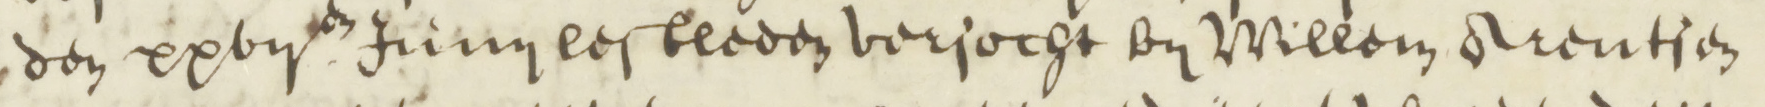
den xxvijen Juny lestleden versocht bij Willem Arentsen
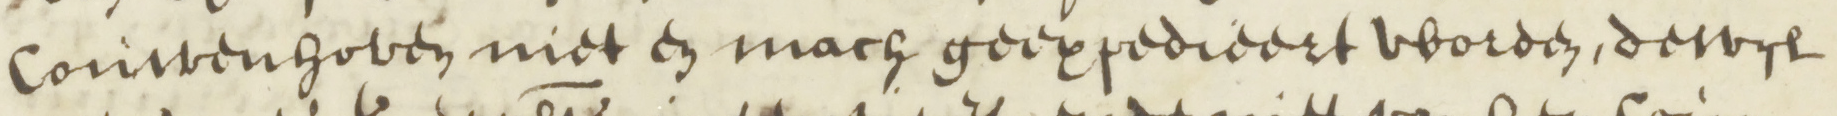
Couwenhoven niet en mach geexpedieert worden, dewyl
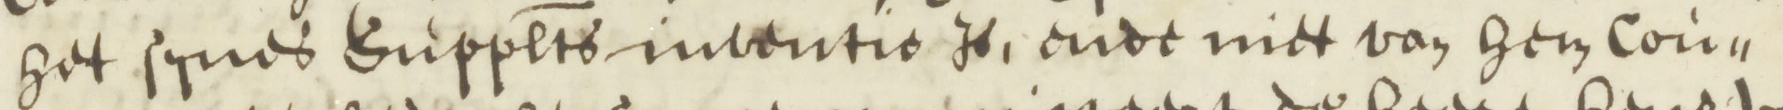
het synes Supplts inventie is ende niet van hem Cou„
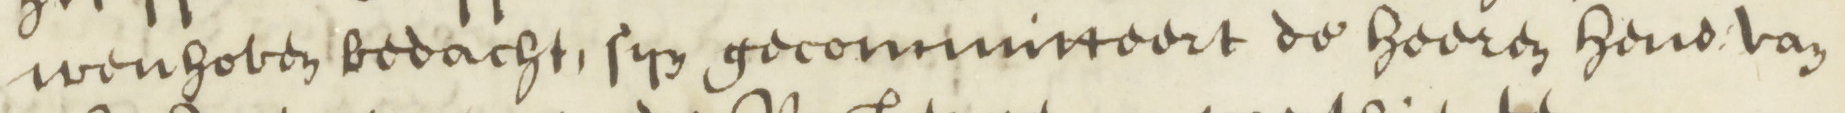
wenhoven bedacht, syn gecommitteert de heeren Hend: van
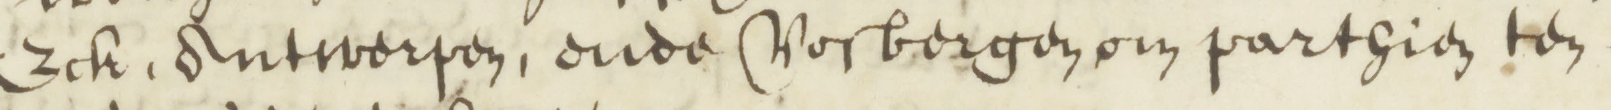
Eck, Antwerpen ende Vosbergen om parthien ten
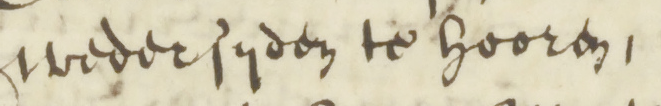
wedersyden te hooren.
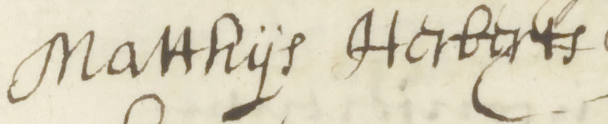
Matthijs Herberts
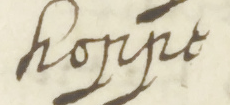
hoppe
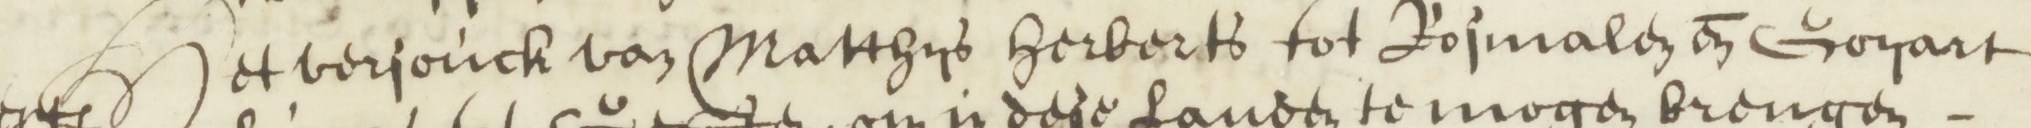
Het versouck van Matthys Herberts tot Rosmalen en Goyart
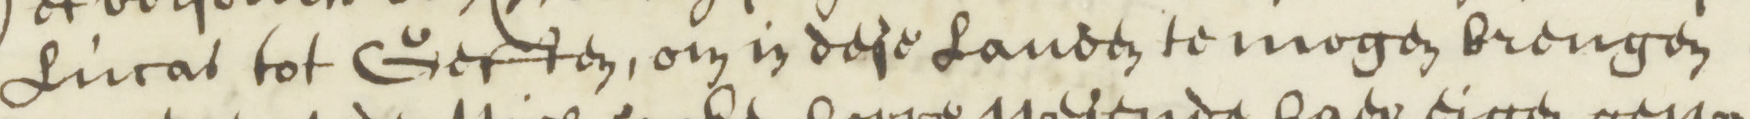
Lucas tot Geffen, om in dese Landen te mogen brengen
